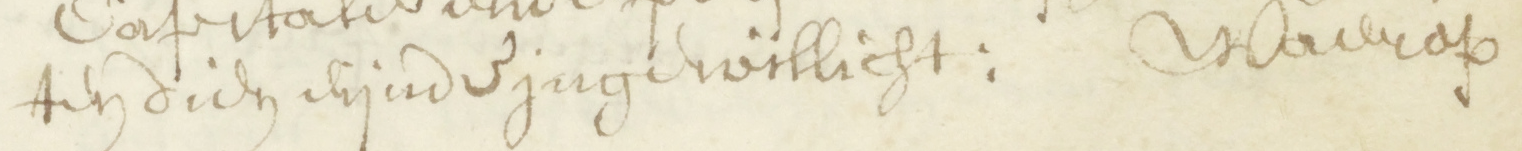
ten dien eijnde ingewillicht: Waerop
